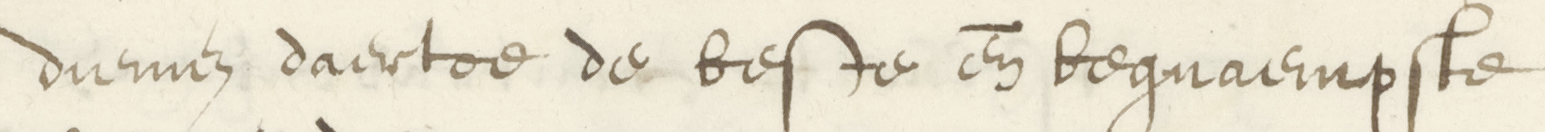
diemen daertoe de beste en bequaempste
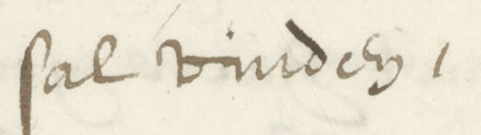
sal vinden.
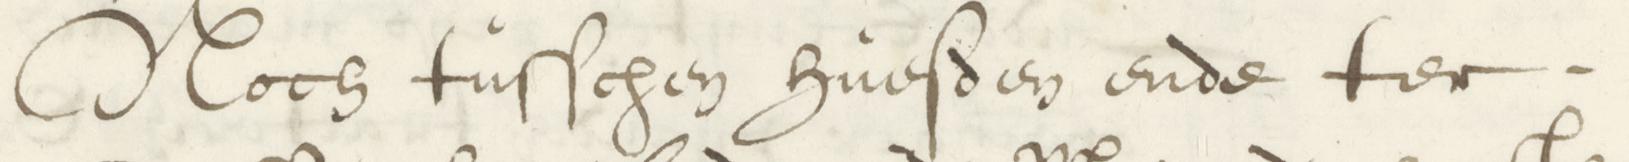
Noch tusschen Huesden ende ter
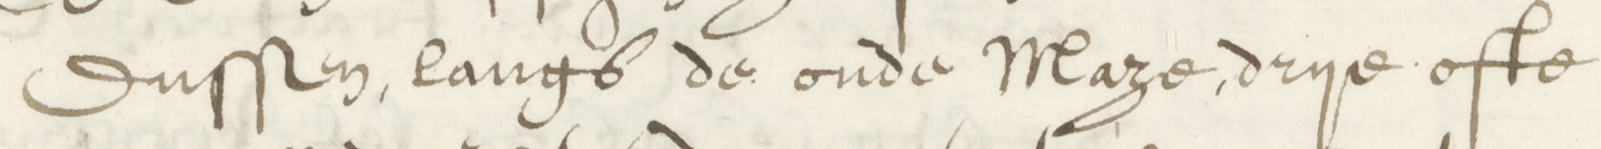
Dussen, langs de oude Maze, drye ofte
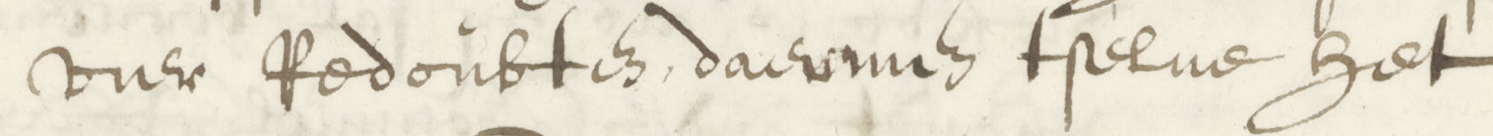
vier Redoubten daermen tselue het
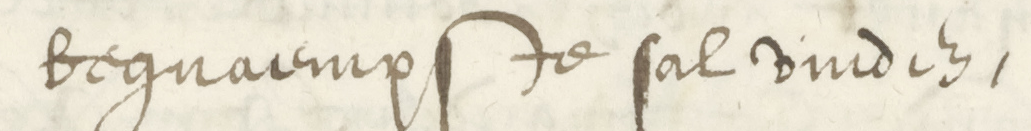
bequaempste sal vinden.
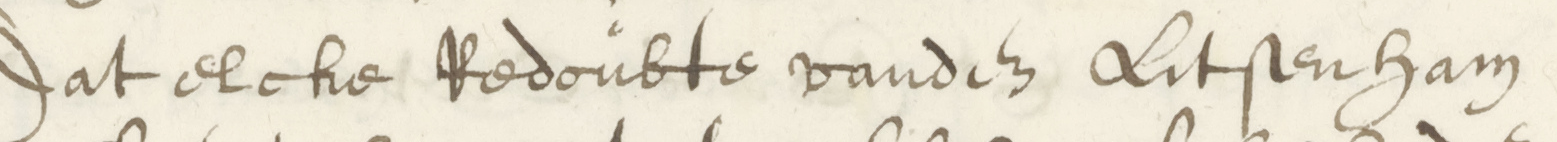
Dat elcke Redoubte vanden Litsenham
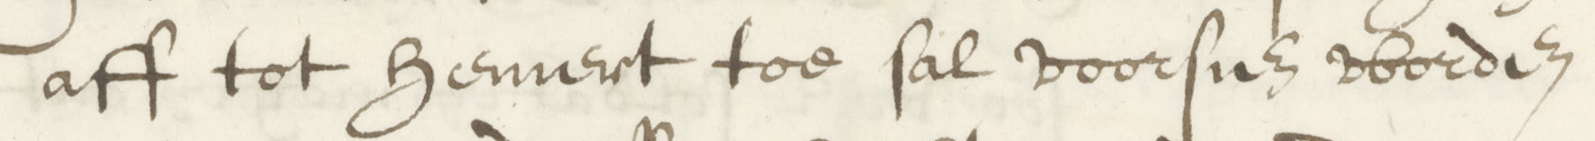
aff tot Hemert toe sal voorsien worden
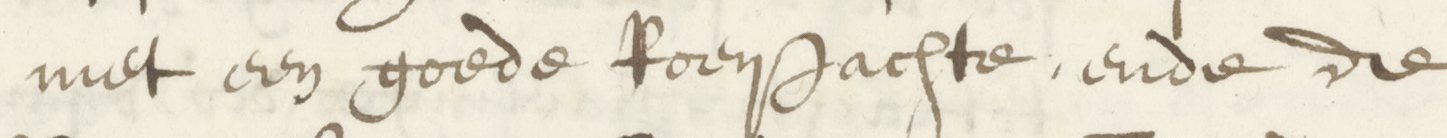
met een goede Roeyjachte ende die
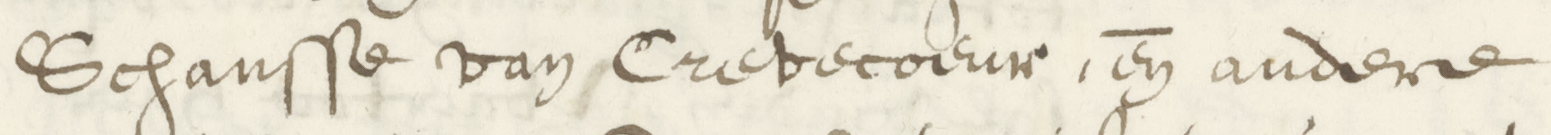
Schansse van Crevecoeur, en andere
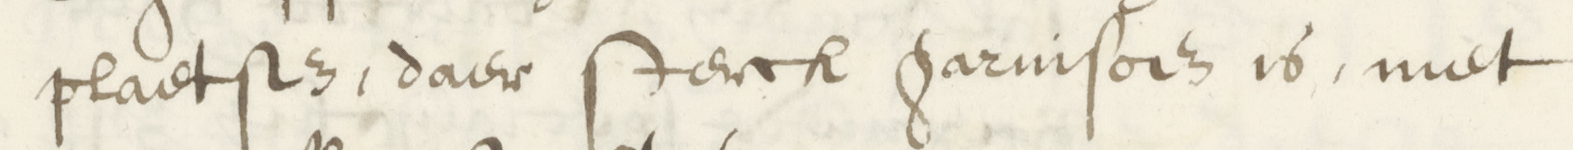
plaetsen, daer sterck garnisoen is, met
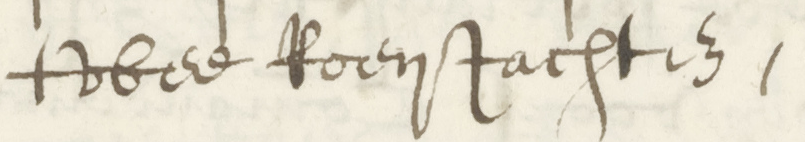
twee Roeyjachten.
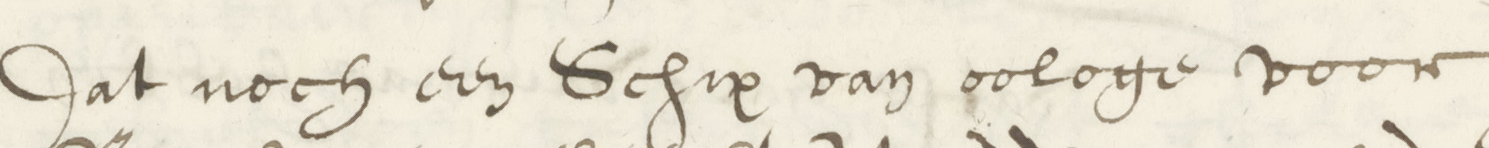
Dat noch een schip van oologe voor
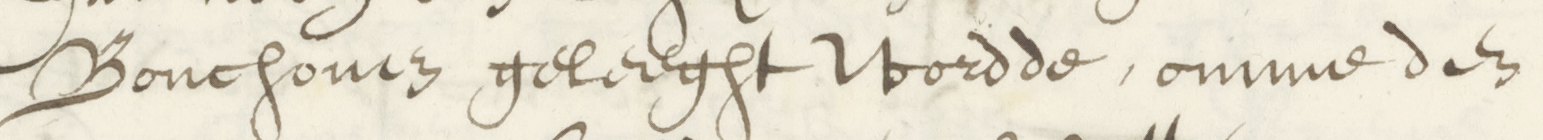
Bouchoven geleeght wordde, omme den
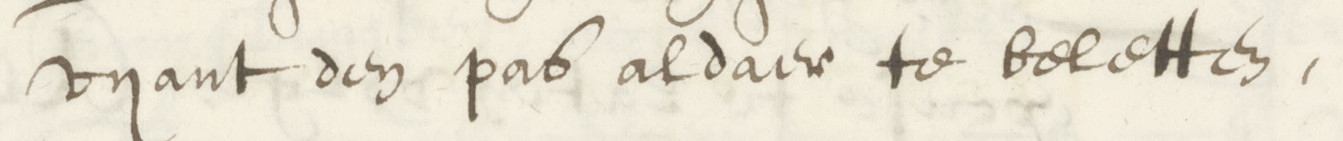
vyant den pas aldaer te beletten.
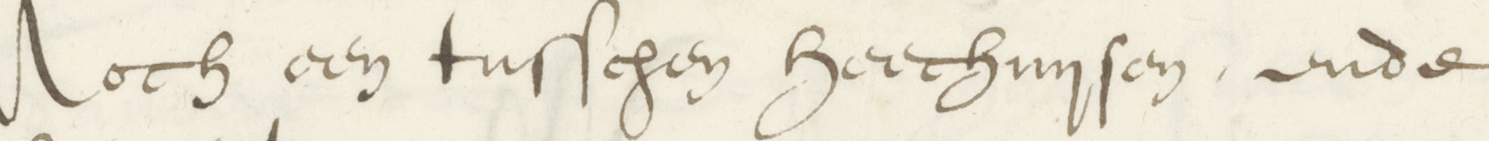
Noch een tusschen Heechuijsen ende
